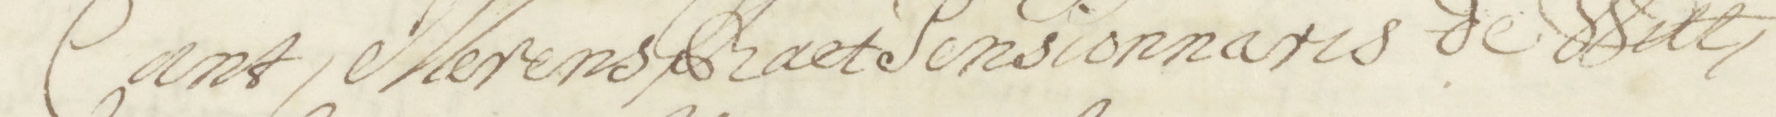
Cant, Merens, Raet Pensionnaris de Witt,
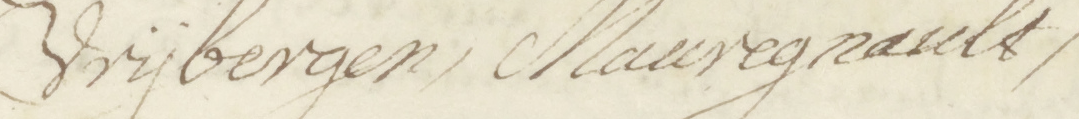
Vrijbergen, Mauregnault
